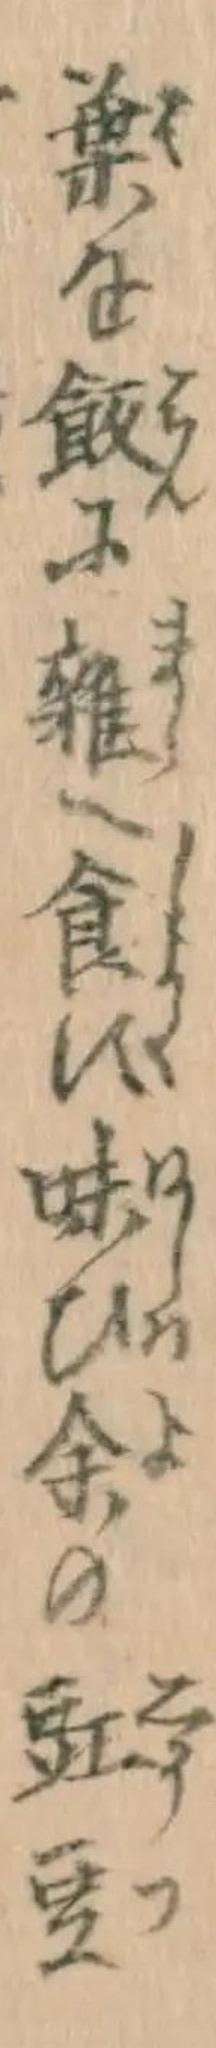葉を飯に雑へ食す味ひ余の豇豆
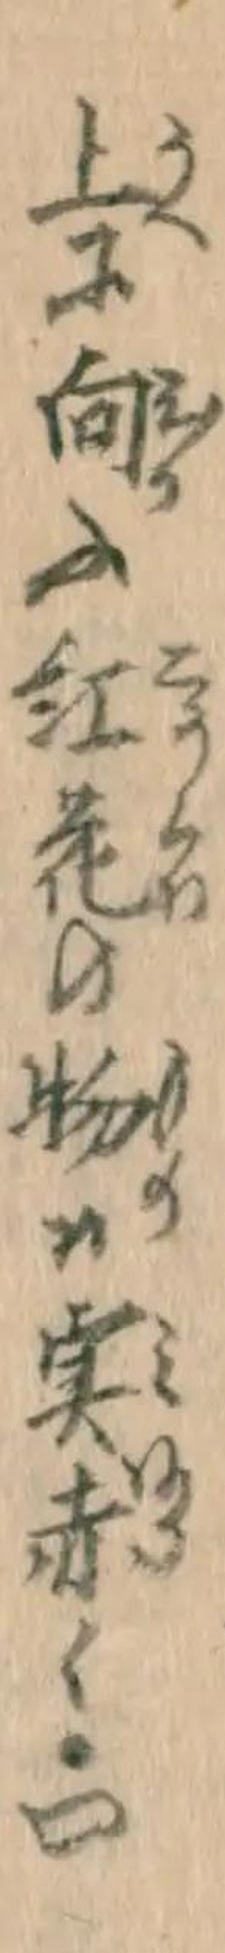上に向ふ紅花の物は実赤く●○
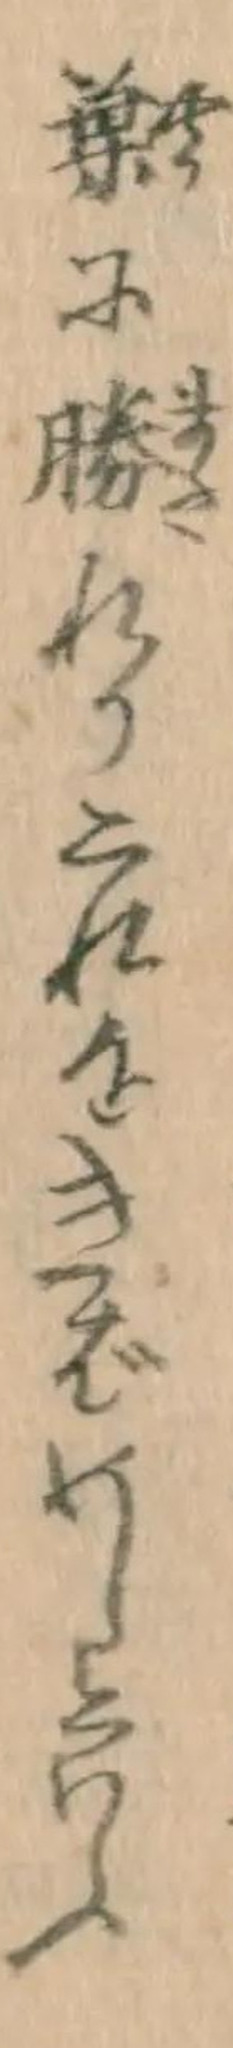葉に勝れりこれをきばめしといふ
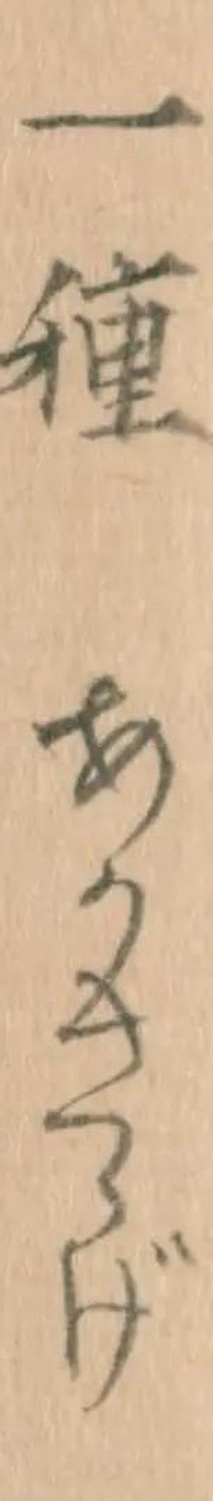一種あかさゝげ
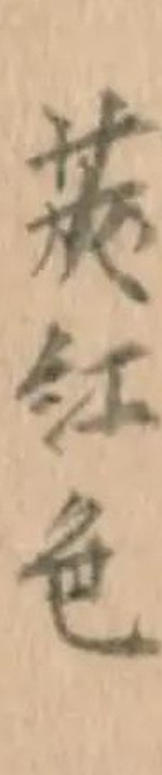莢紅色
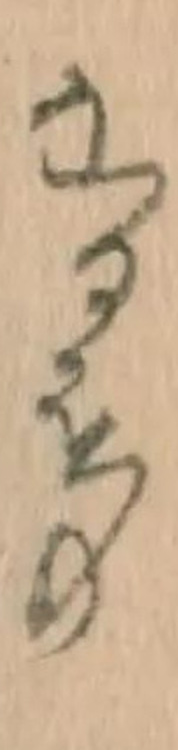なるもの
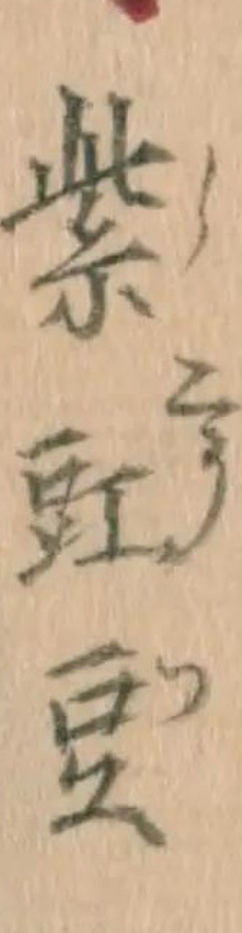紫豇豆
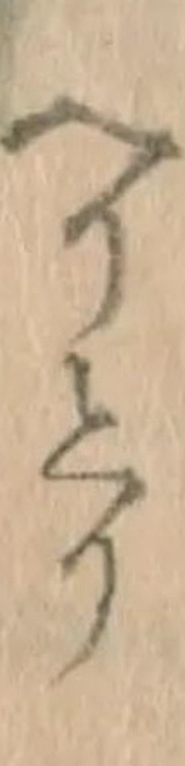へりとり
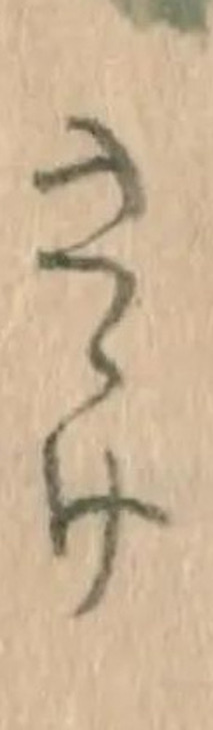さゝけ
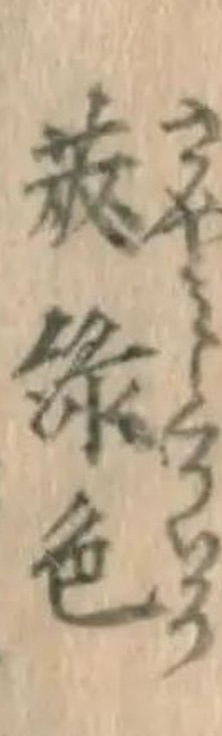莢紅色
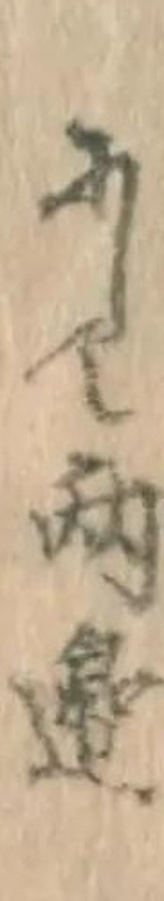にして両辺

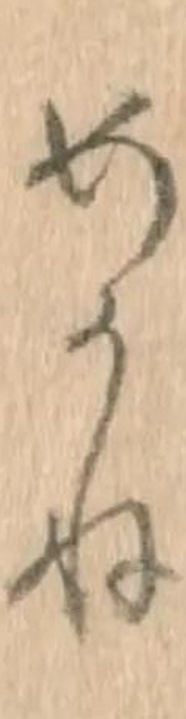めかね
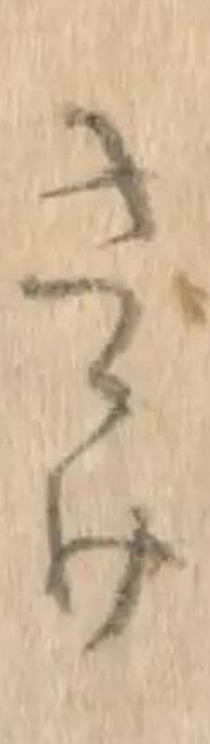さゝけ
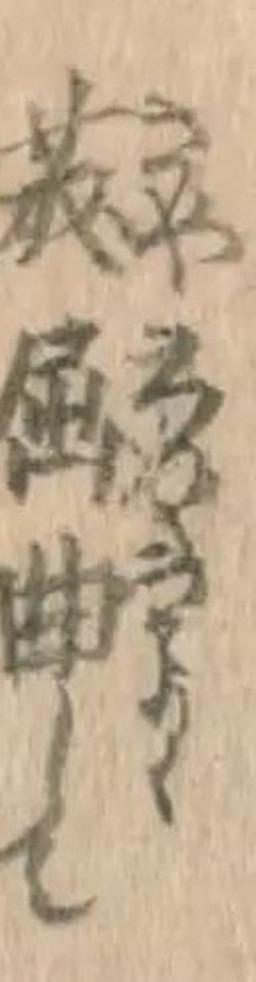莢屈曲して
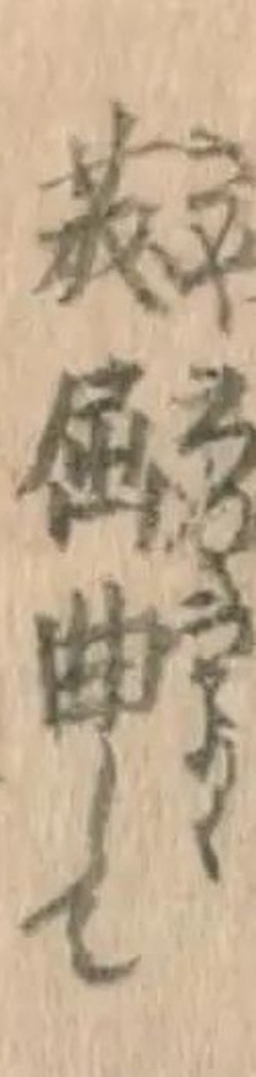莢屈曲して
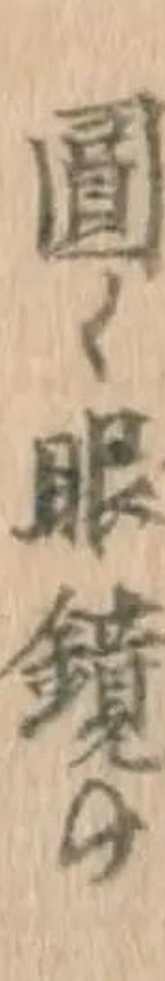円く眼鏡の
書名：本草図譜. 巻43-45
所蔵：国立国会図書館 National Diet Library, JAPAN
